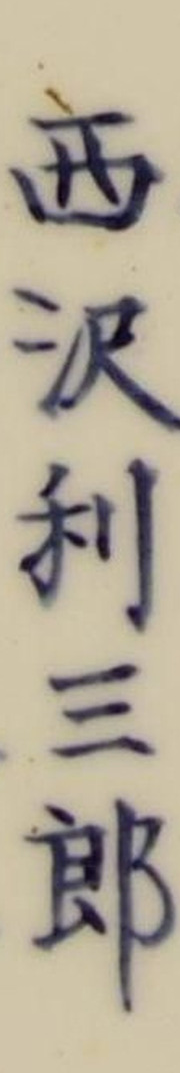西沢利三郎
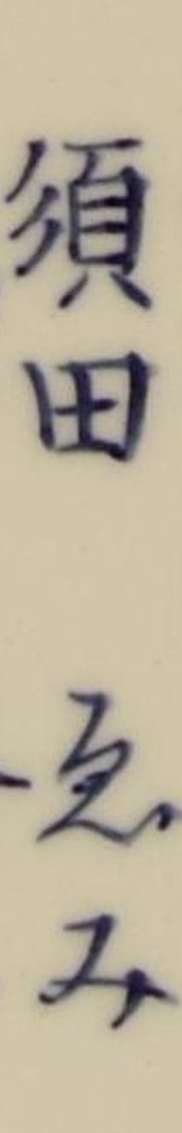須田ゑみ
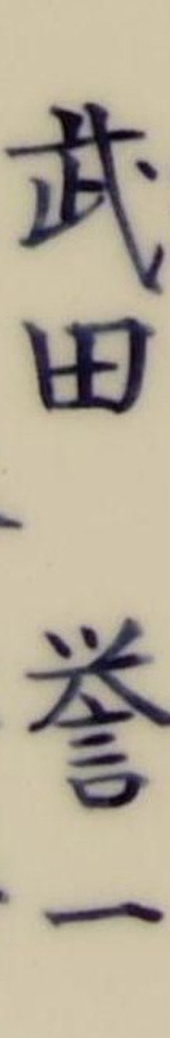武田誉一
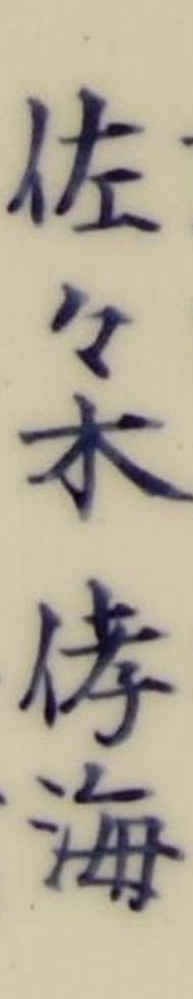佐々木侾海
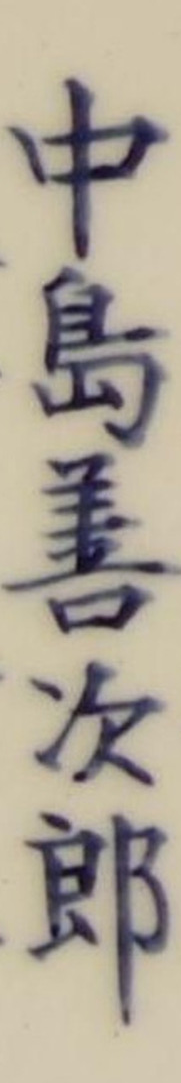中島善次郎
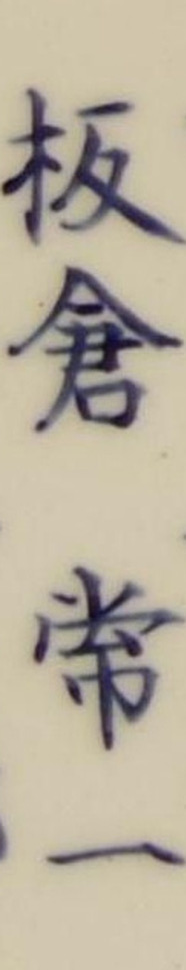板倉常一
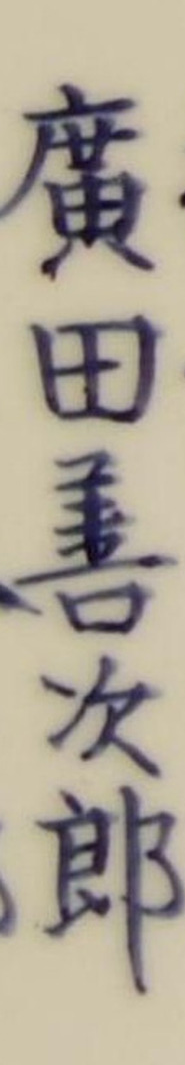廣田善次郎
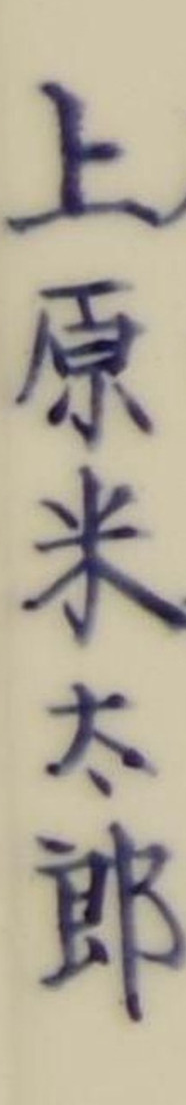上原米太郎

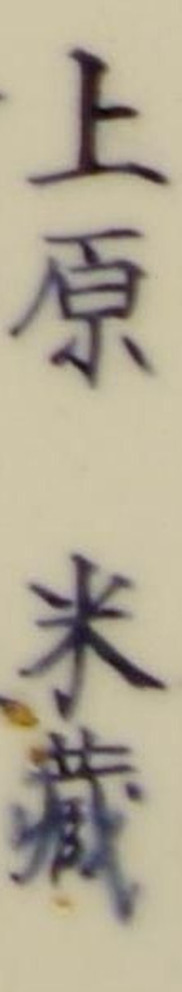上原米蔵
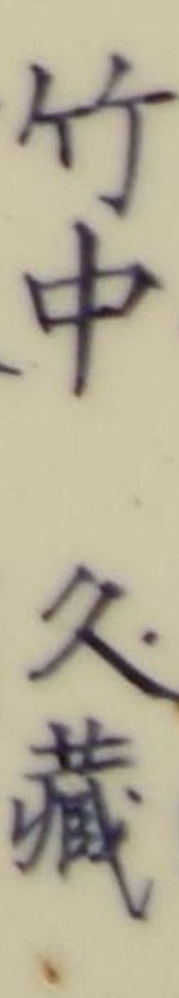竹中久蔵
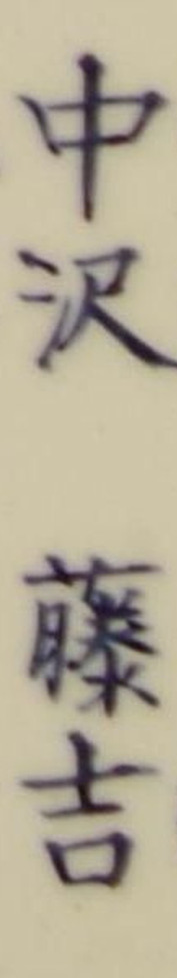中沢藤吉
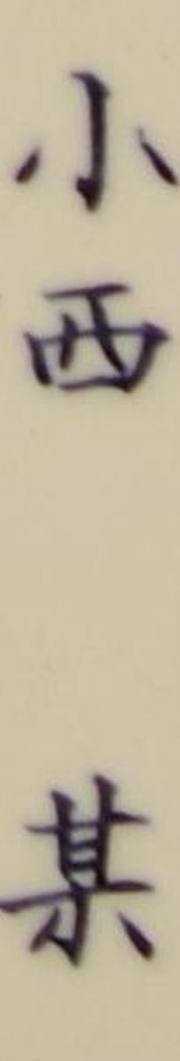小西某
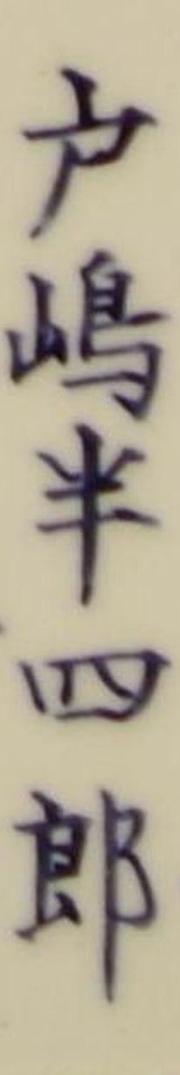戸嶋半四郎
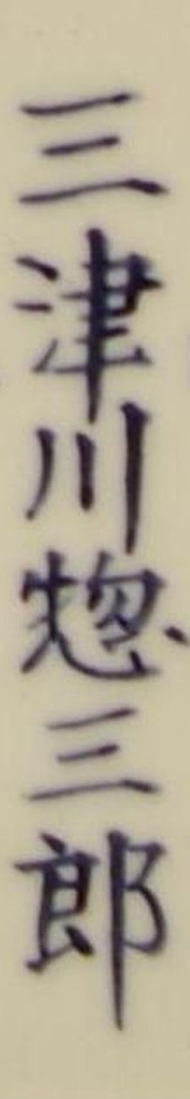三津川惣三郎
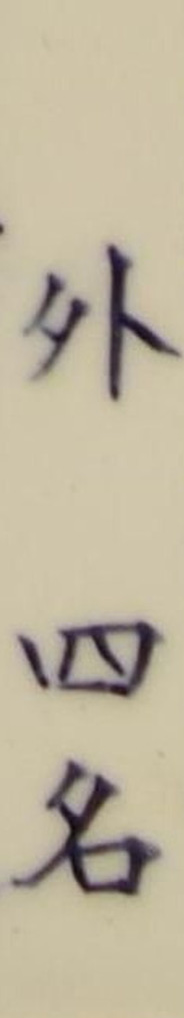外四名
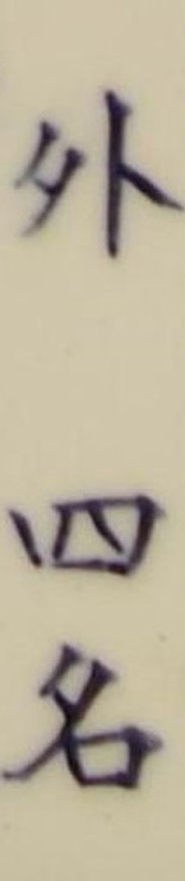外四名
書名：E~L
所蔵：高野山金剛峯寺
